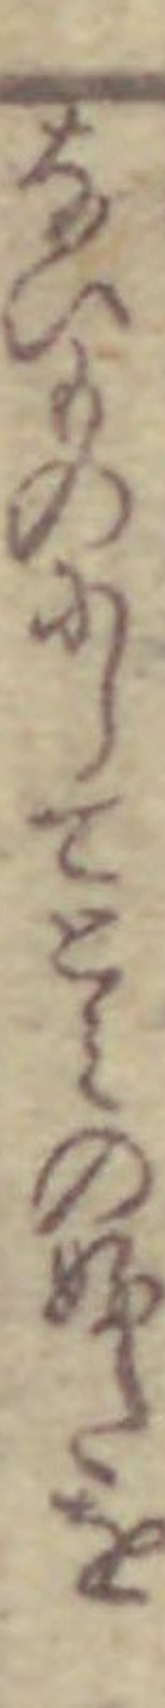ないものにしてとみのふたを
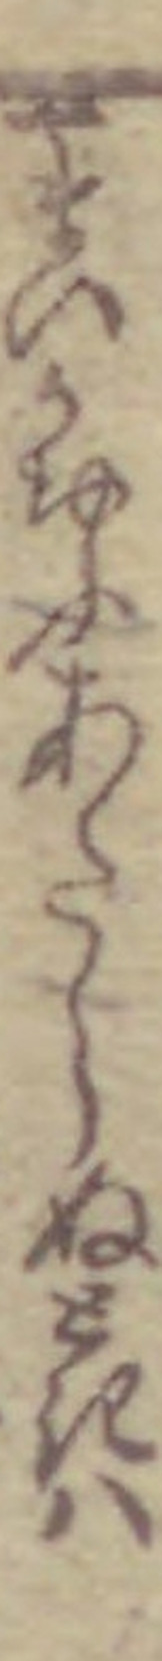一まいかおふあたらぬときは
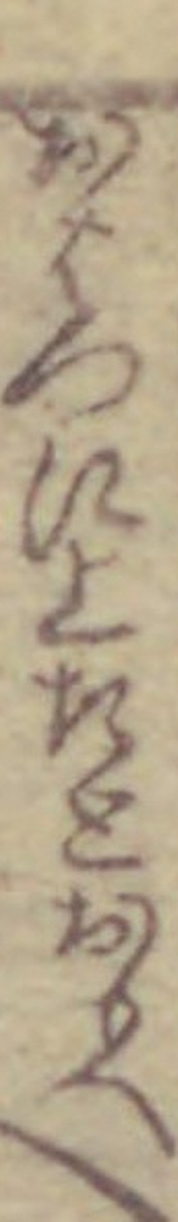おはつに上たとおもへば
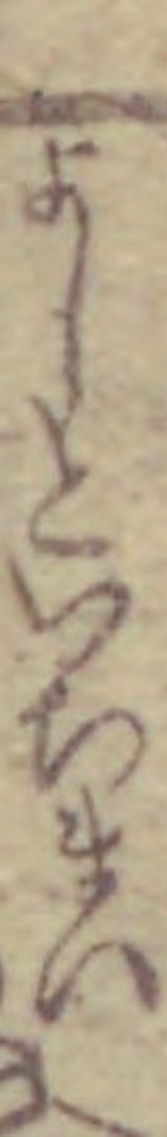よしといちまい
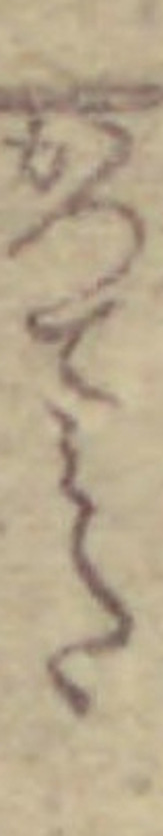かつてみた
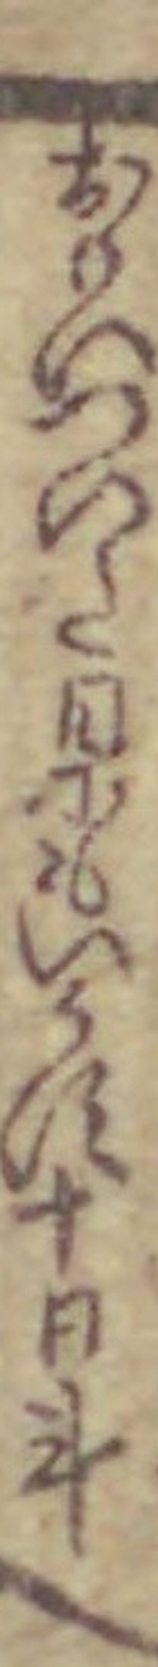おもいついた日にもいかす十日斗
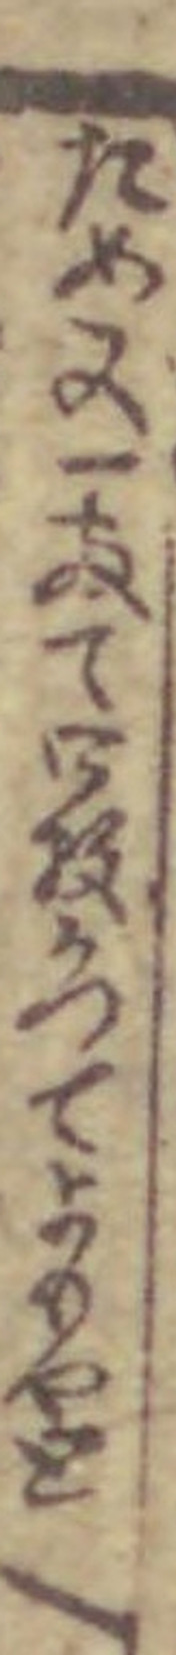ため又一両て四枚かつてよもやと
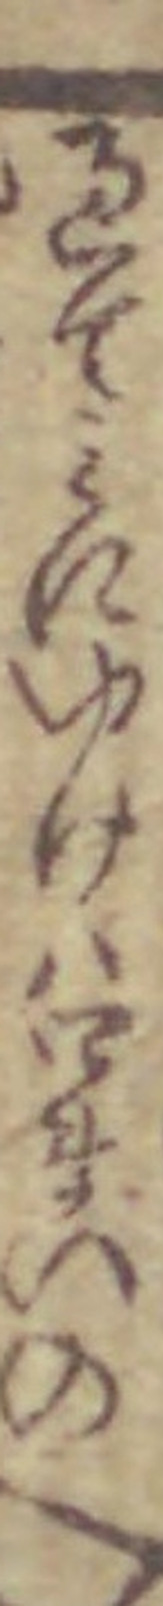過てみにゆけば四まいの
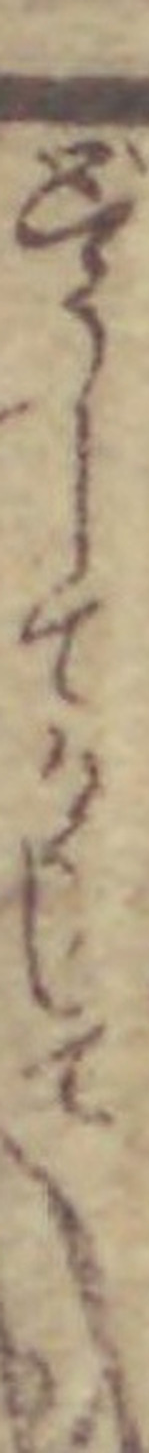どうしてかうして
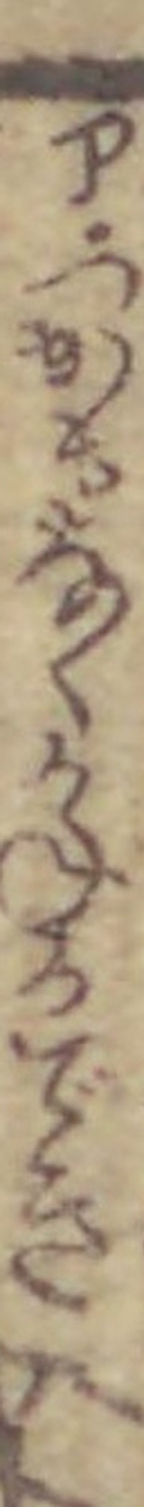りつかもなくかねかでき
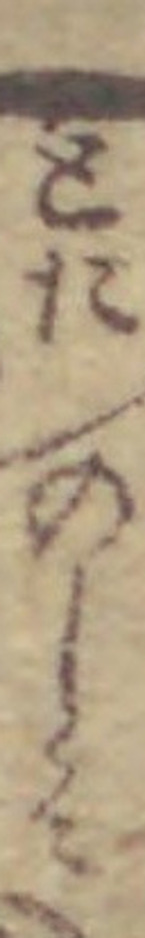とたのしみ

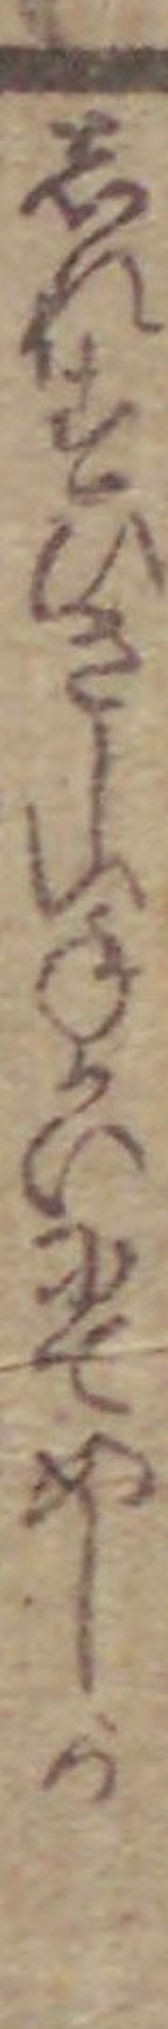しれすひさしいねかいにてめしか
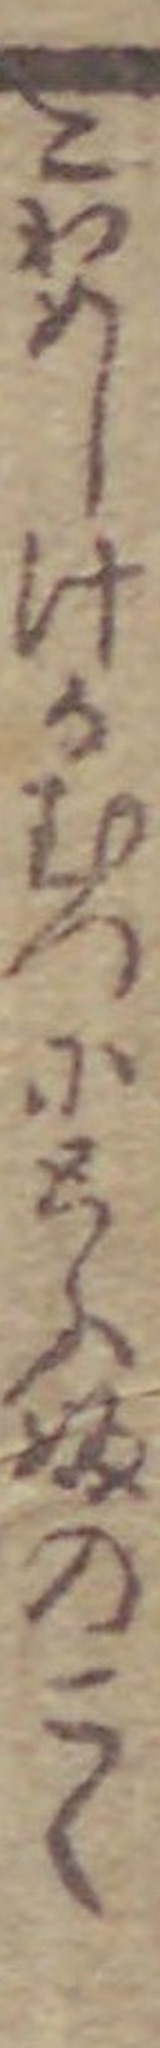こわめし汁かむつにとふふのこく
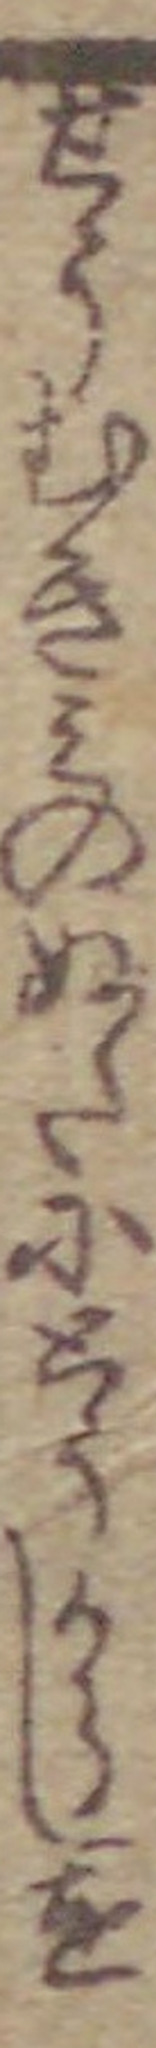せうむきみのぬたにとうからしを
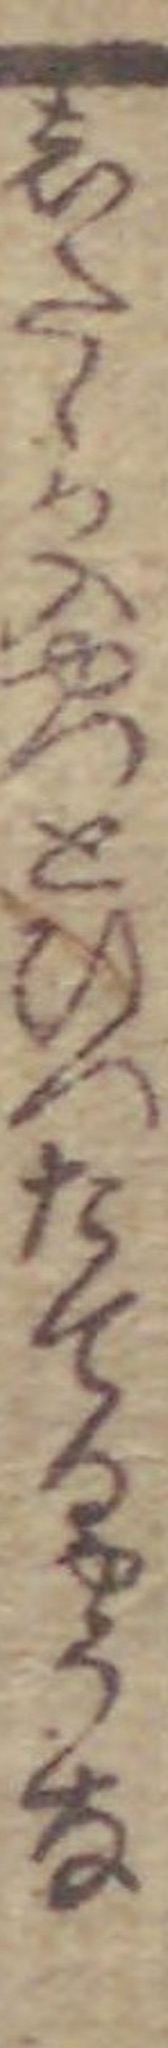したゝか入やつとひつたてるやうな
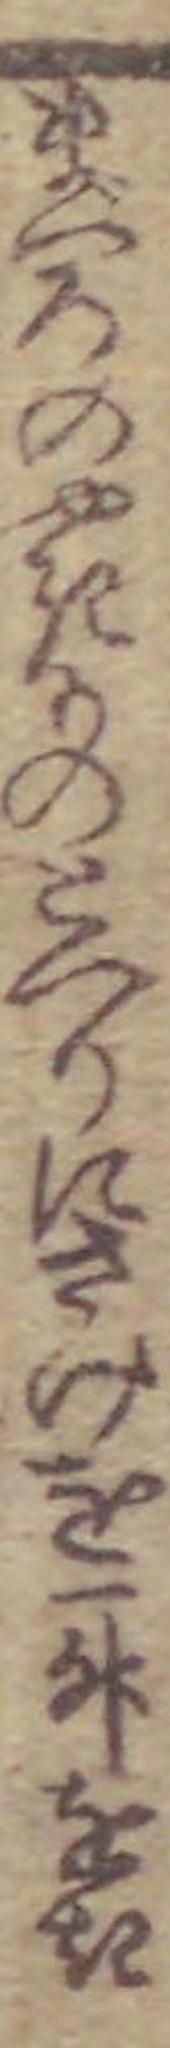まぐろのやきものとくりにさけを一升をき
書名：思事夢濃枕 3巻
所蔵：国立国会図書館 National Diet Library, JAPAN
